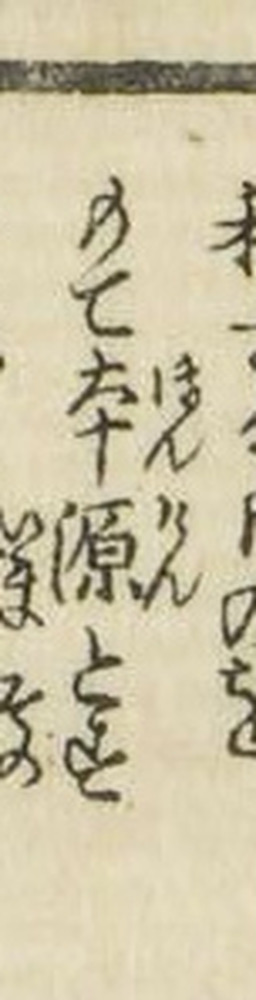もて本源とす
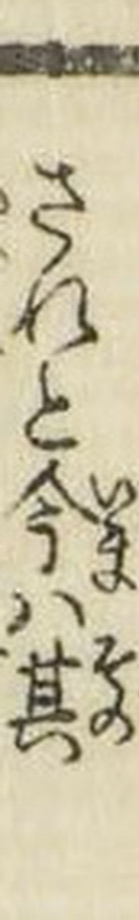されと今は其
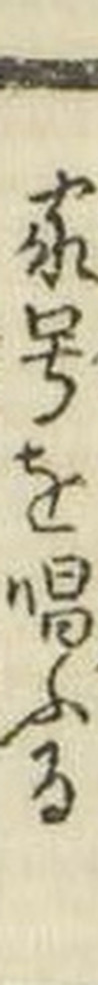家号を唱ふる
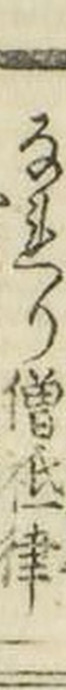なれり僧祗律
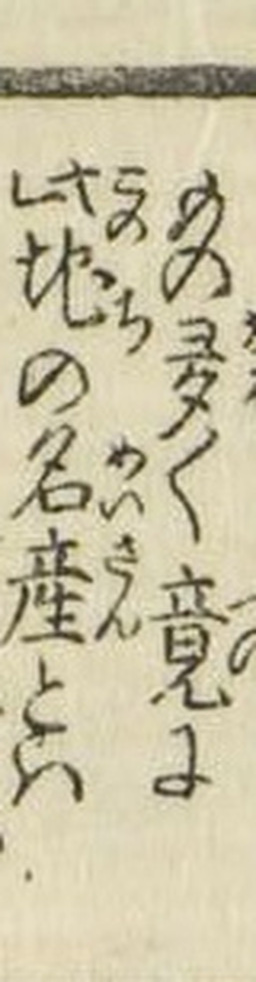此地の名産とは
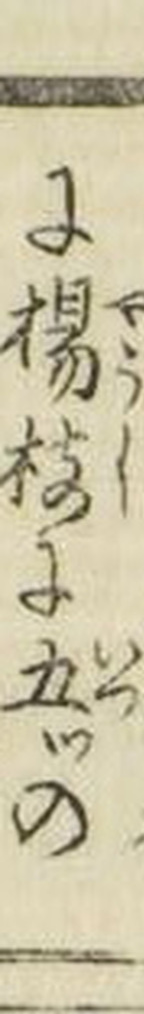に楊枝に五ッの
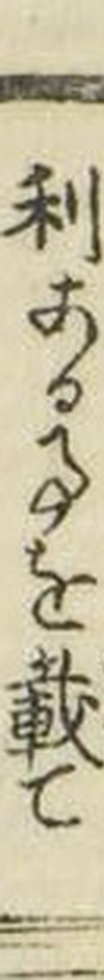利ある事を載て
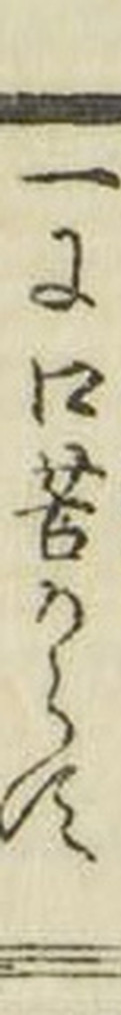一に口苦からす
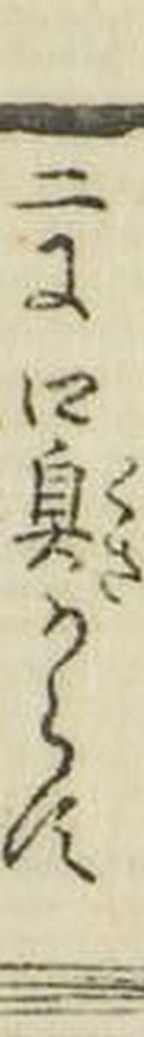二に口臭からす
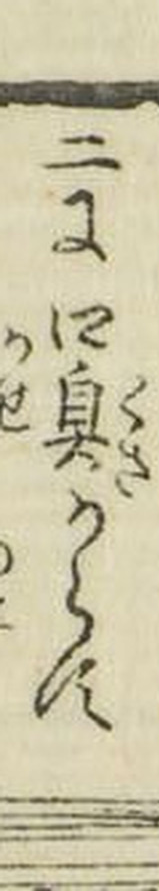二に口臭からす
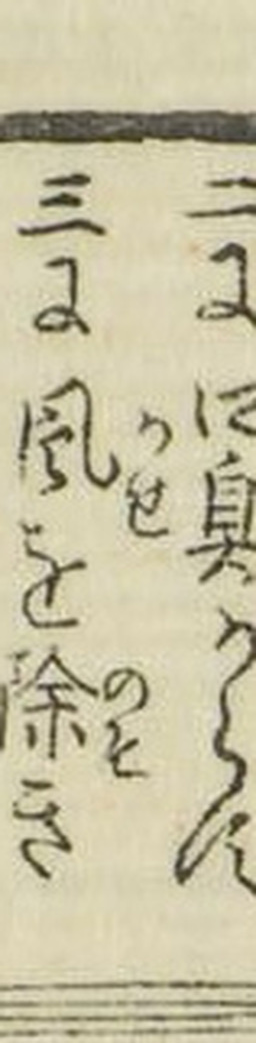三に風を除き
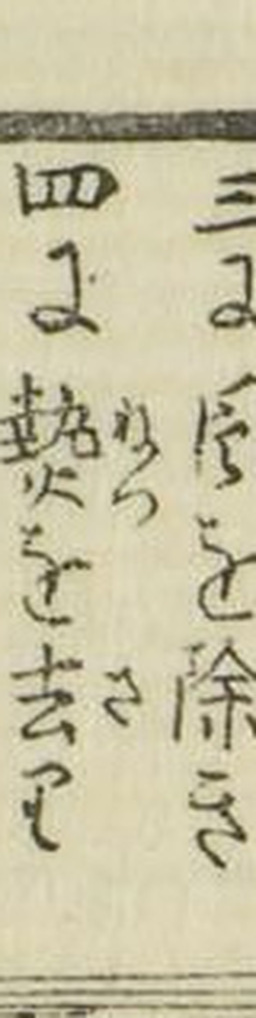四に熱を去り
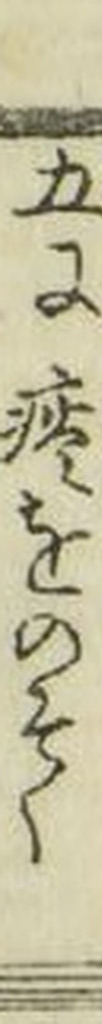五に痰をのそく
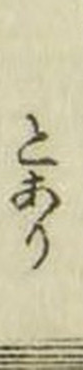とあり
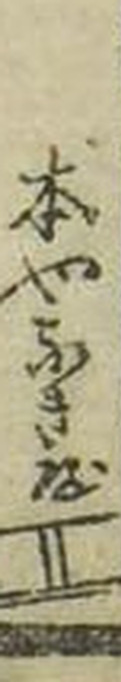本やなき屋
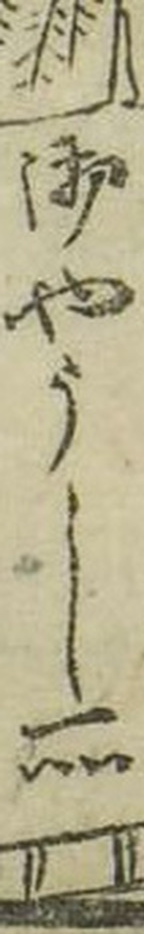御やうし所
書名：江戸名所図会 20巻 巻之16
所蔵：東京学芸大学教育コンテンツアーカイブ
